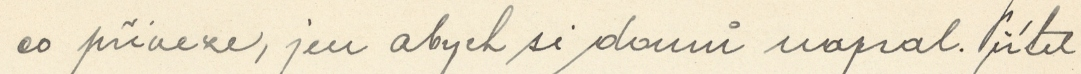co přiveze, jen abych si domů napsal. Přítel
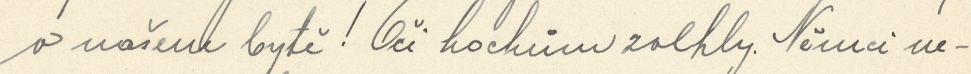v našem bytě! Oči hochům zvlhly. Němci ne-
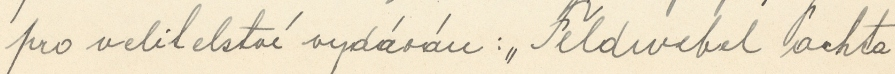pro velitelství vydáván: „Feldwebel Pachta
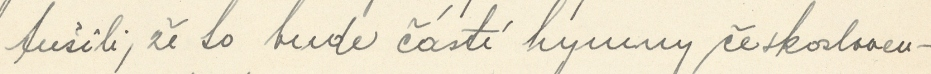tušili, že to bude částí hymny českosloven-
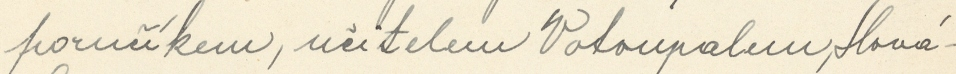poručíkem, učitelem Votoupalem, Slová-
